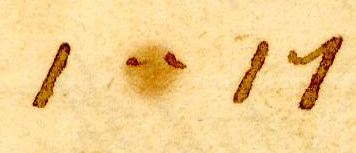1 - 17
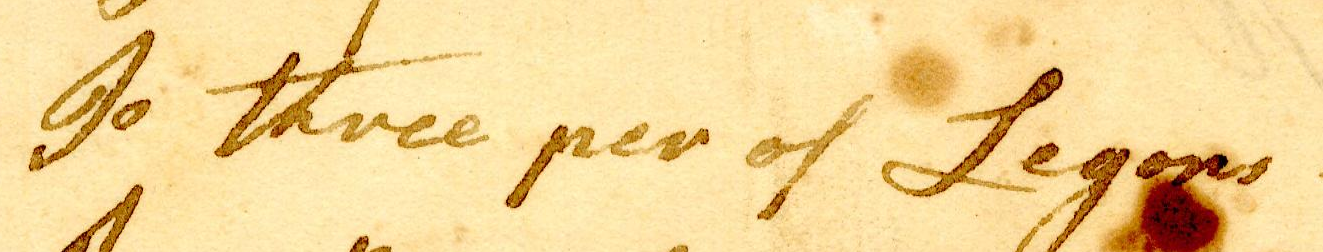To three per of Legons
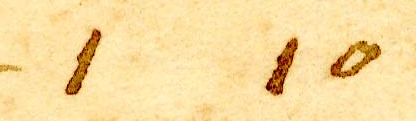- 1 - 10
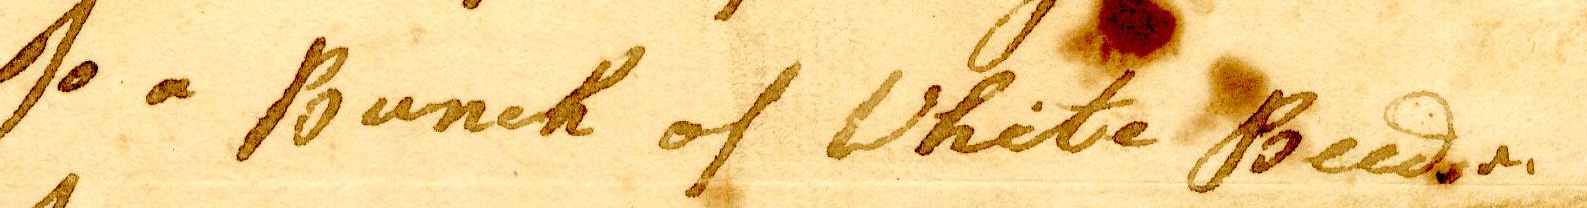To a Bunch of White Beeds.
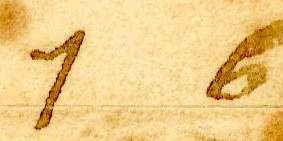1 6
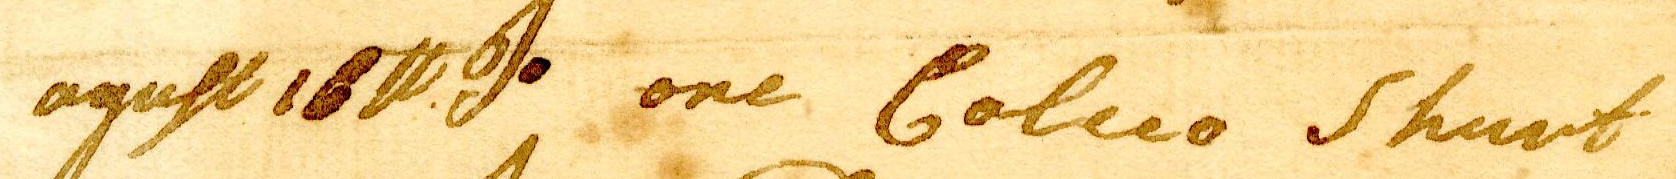agust 16th To one Calico Shurt-
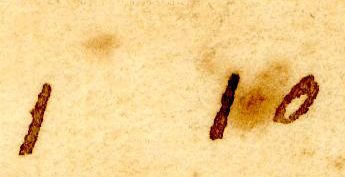1 10
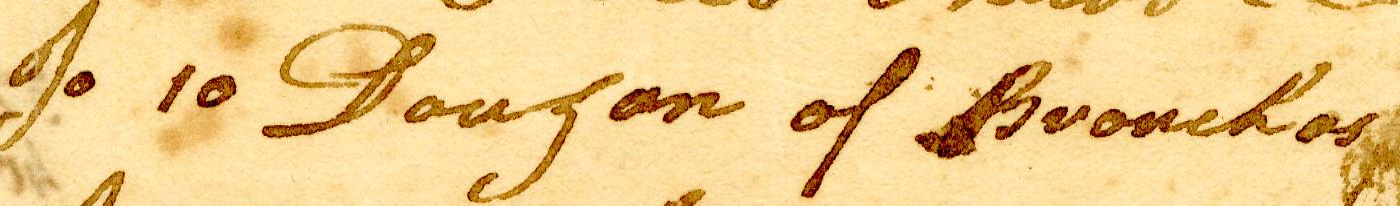To 10 Douzon of Brouches
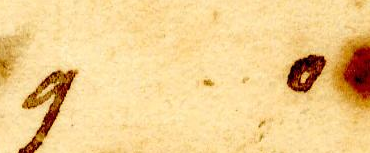9 - 0
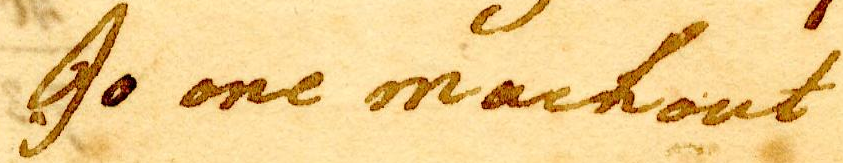To one machout
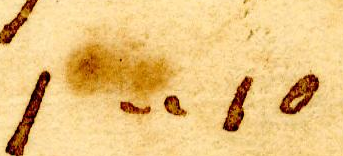1 - 10
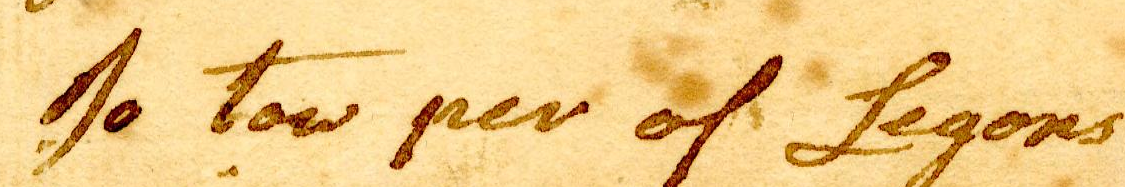To ton per of Legons
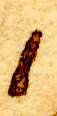1
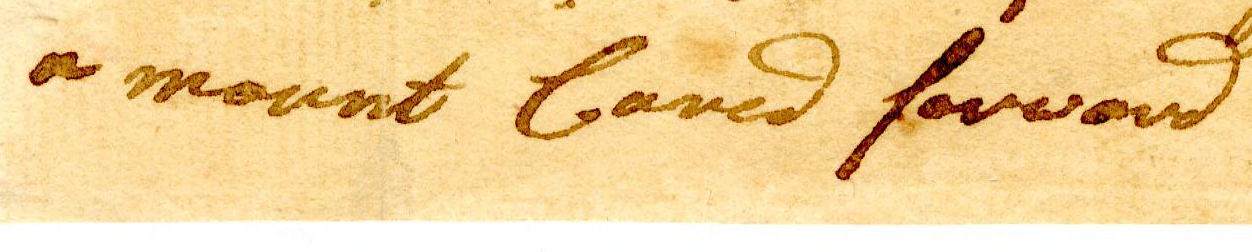a mount Cared forward
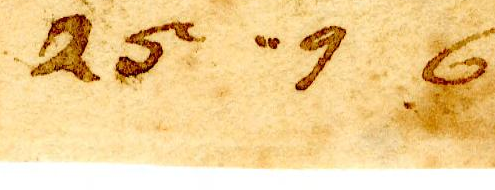25 - 9 - 6
